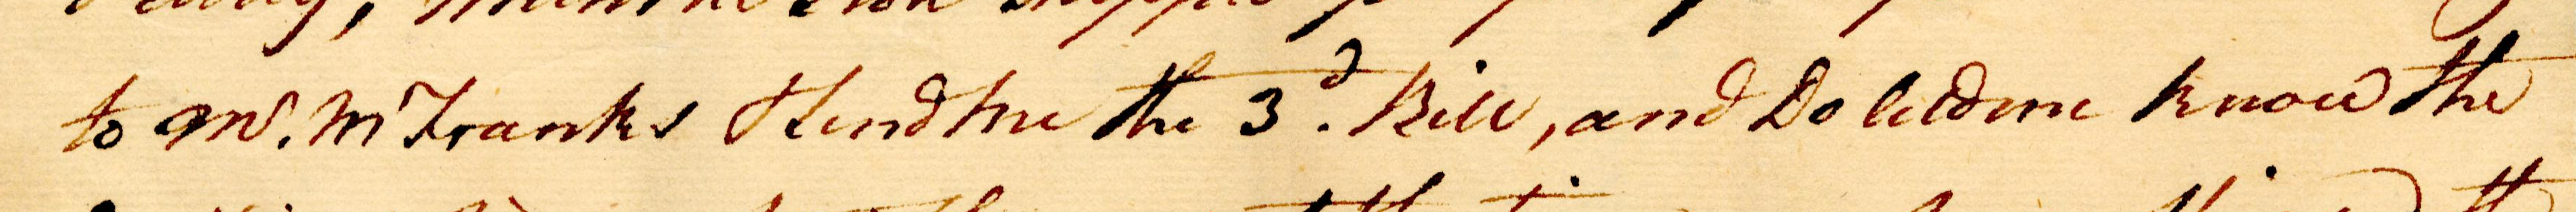to M^r. M Franks & send me the 3^d. Bill, and Do letd me know the
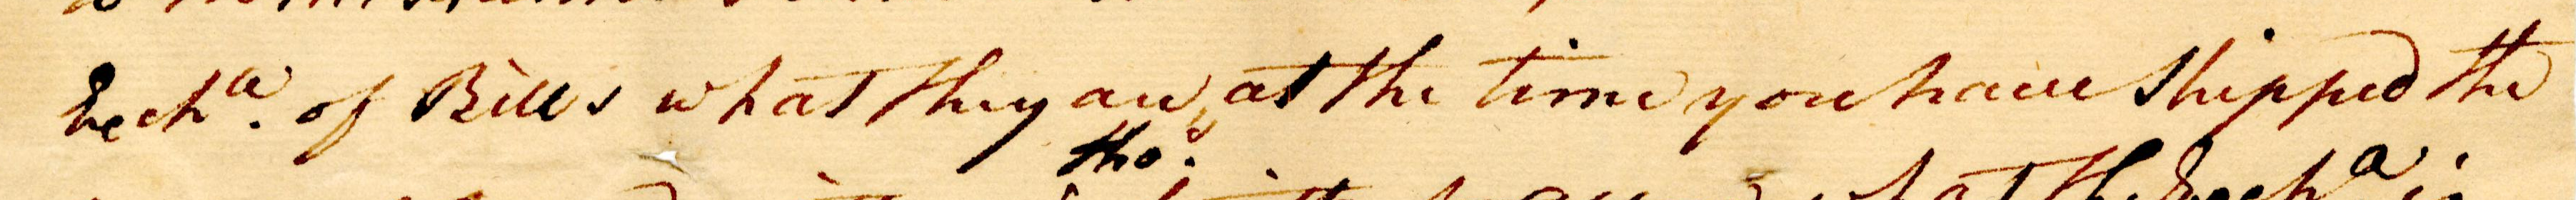Exch^a. of Bills what they are, at the time you have shipped the
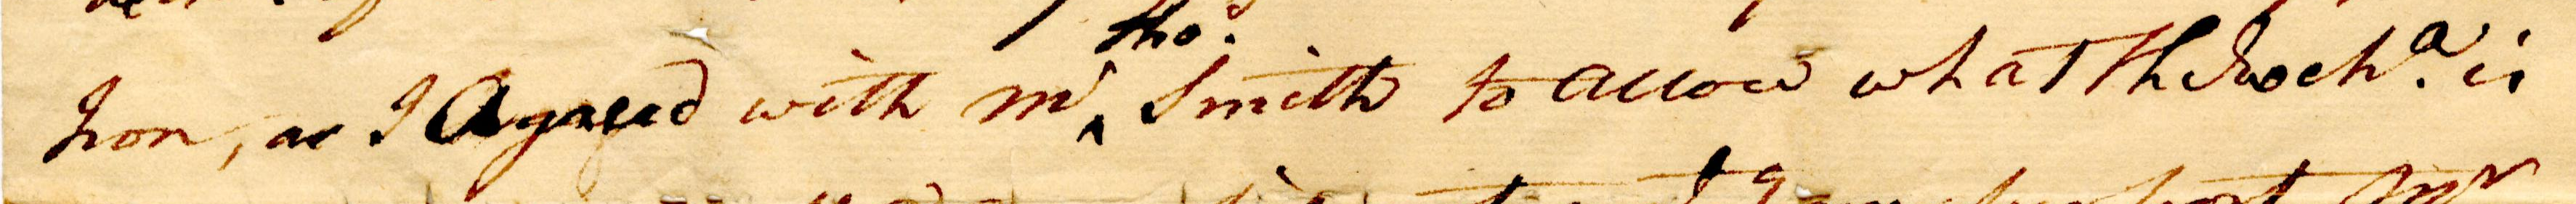Iron, as I agreed with M^r ^ Smith to allow what the Ixch^a is
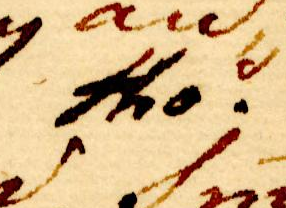tho^s.
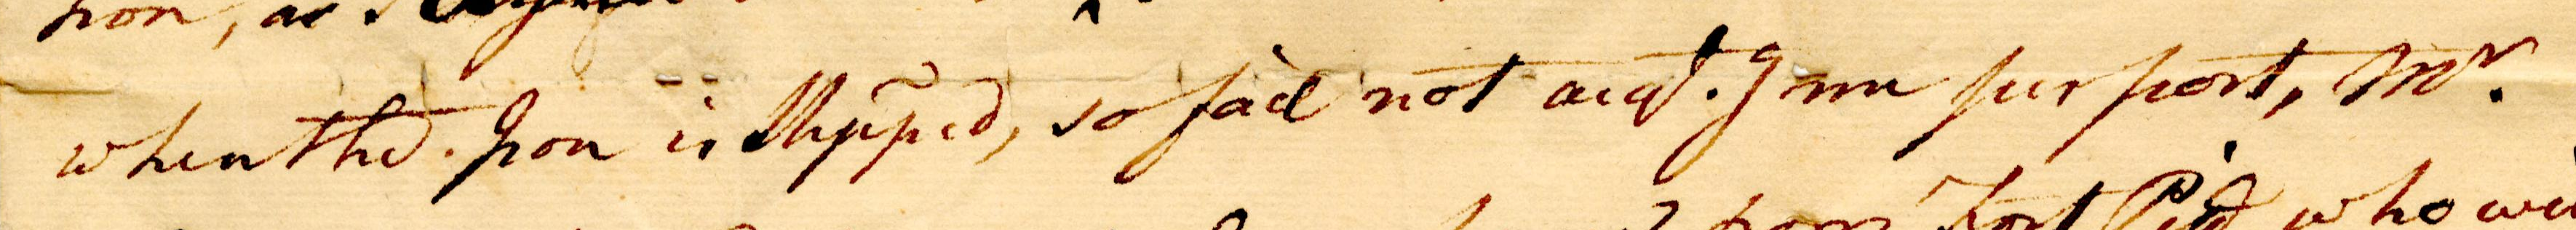when the Iron is shipped, so fad not acq^t.g me per post, M^r
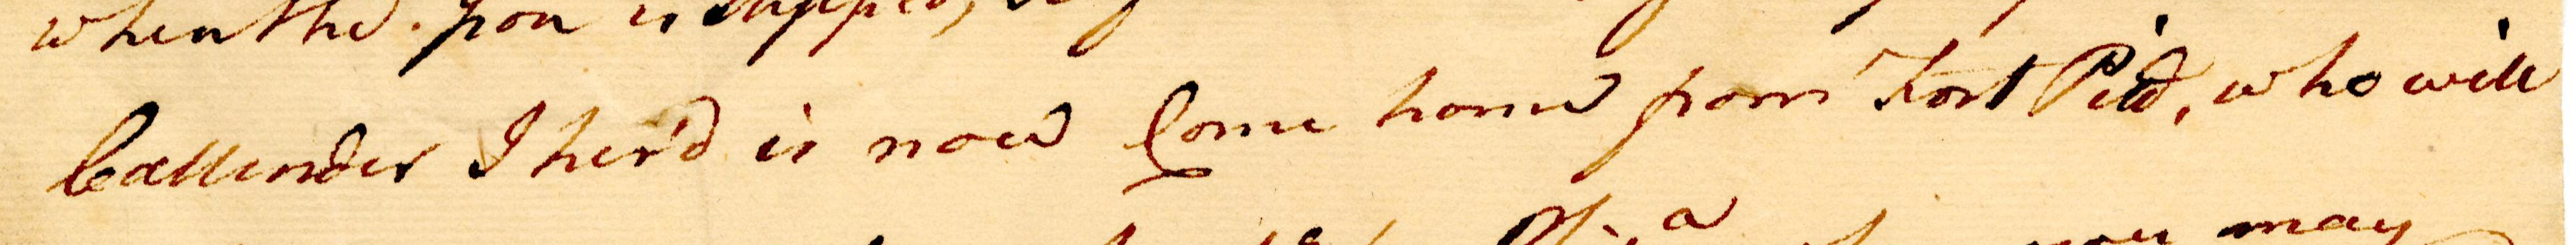Callender I her'd is now Come home from Fort Pitd, who will
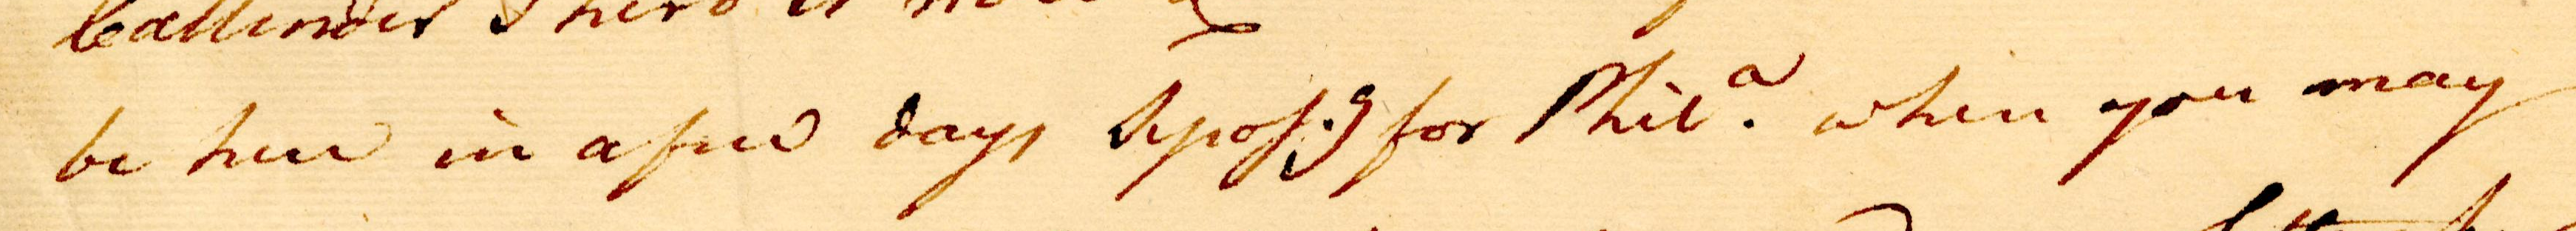be here in a few days Depos.g for Phil^a. when you may
